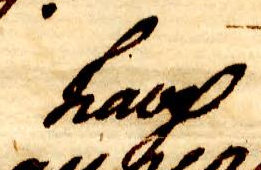have
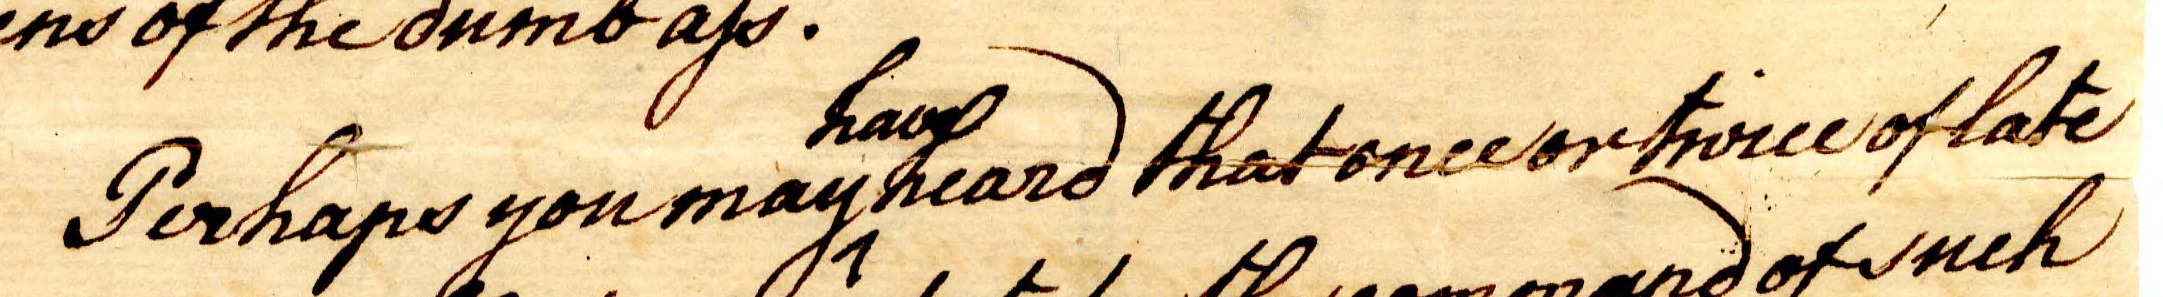Perhaps you may ^ heard that once or twice of late
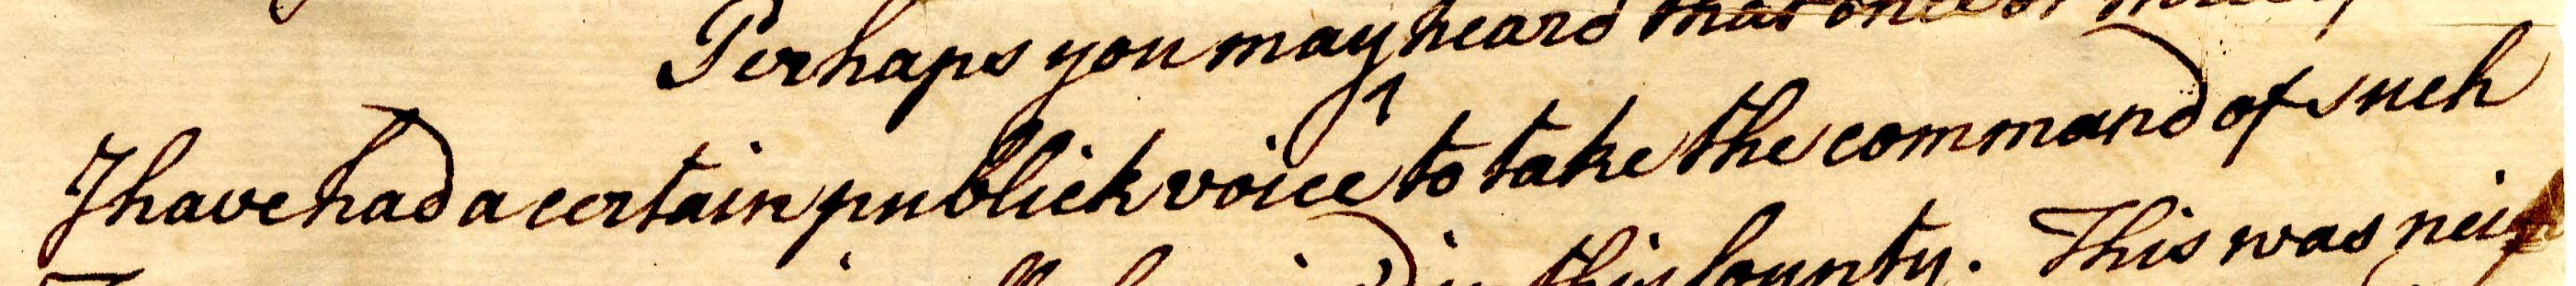I have had a certain publick voice to take the command of such
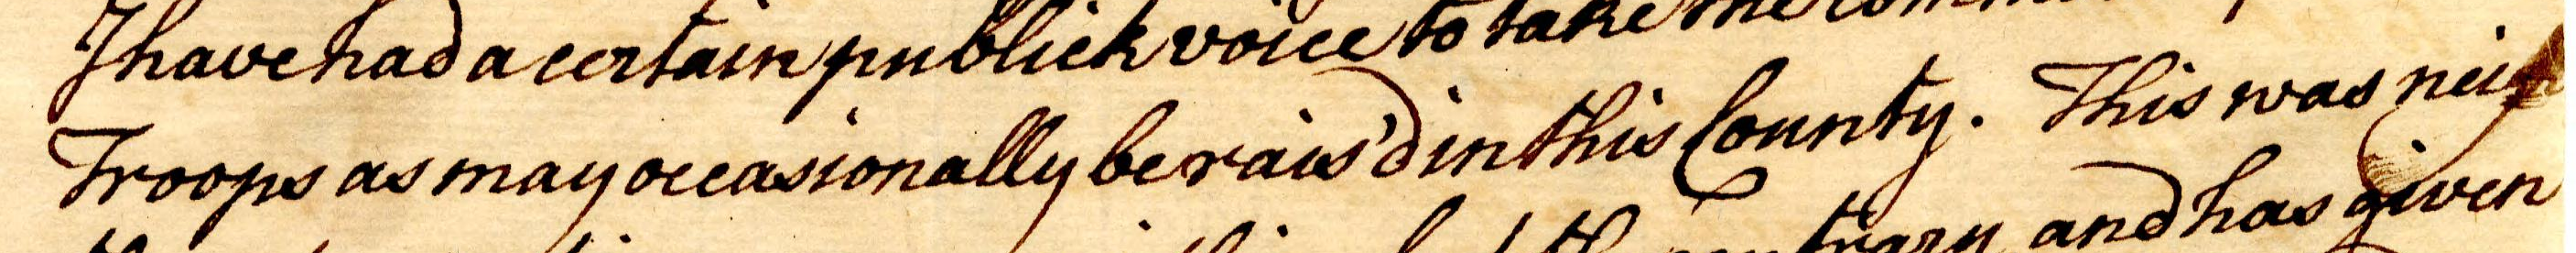Troops as may occasionally be rais'd in this County. This was neit-
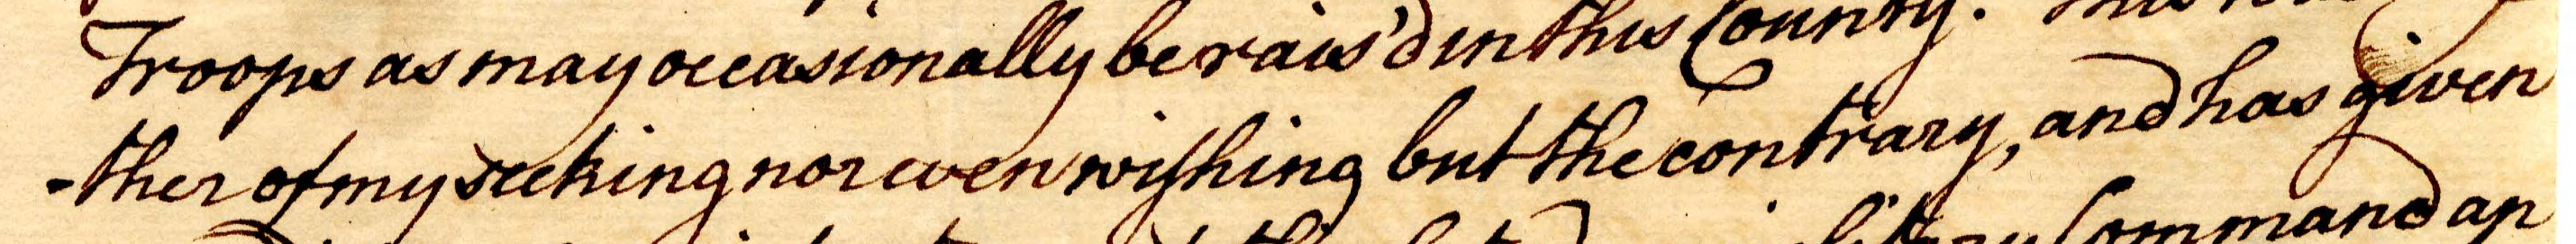-ther of my seeking nor even wishing but the contrary, and has given
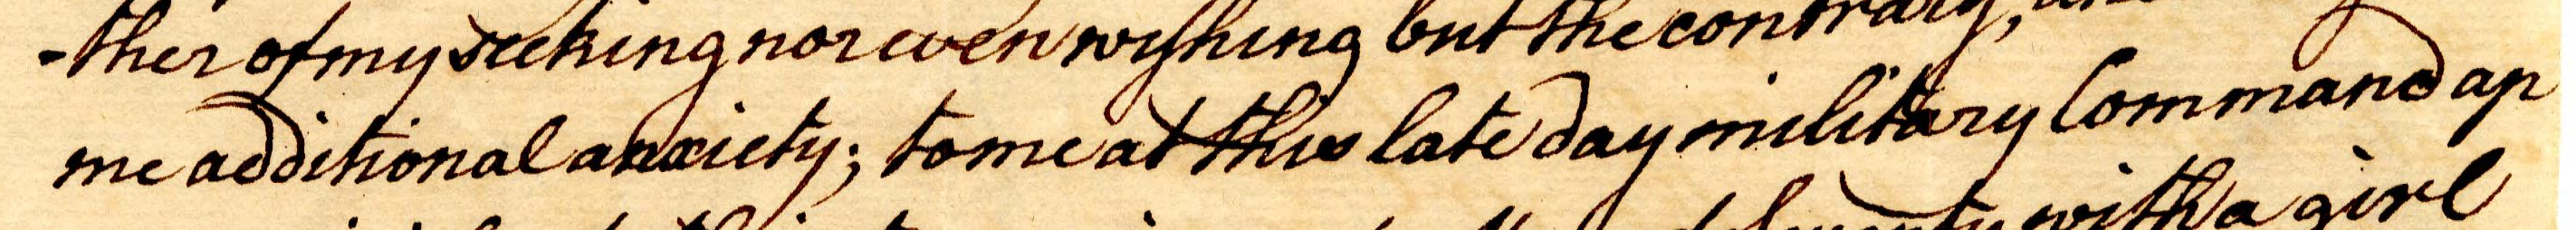me additional anxiety; to me at this late day military Command ap
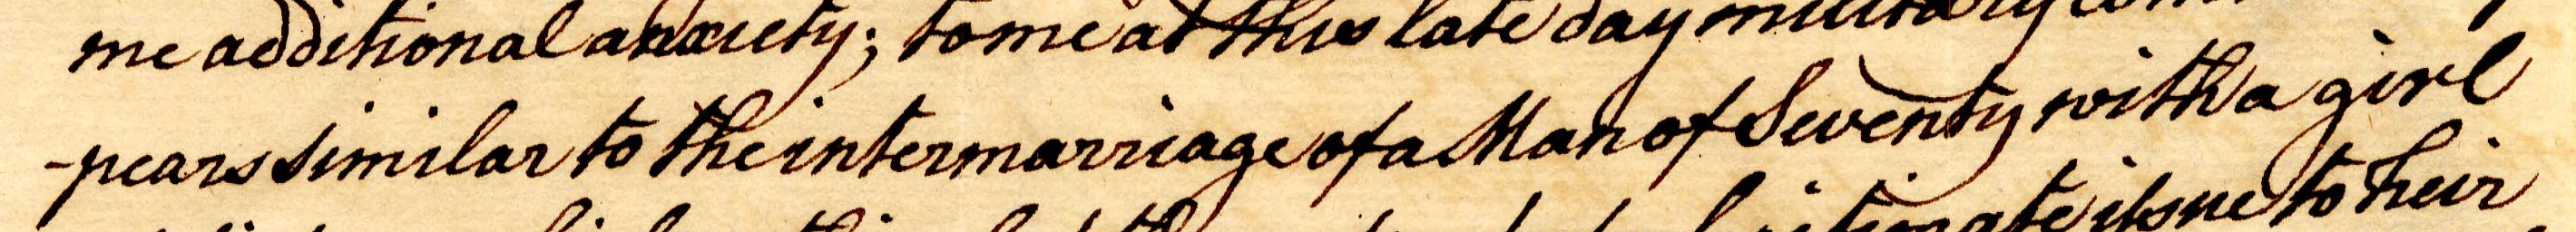-pears similar to the intermarriage of a Man of Seventy with a girl
